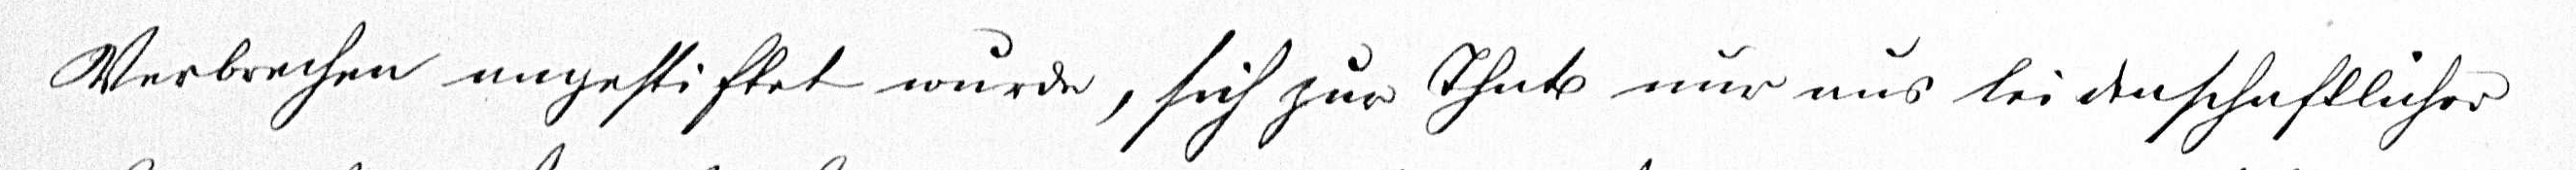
Verbrechen angestiftet wurde, sich zur That nur aus leidenschaftlicher
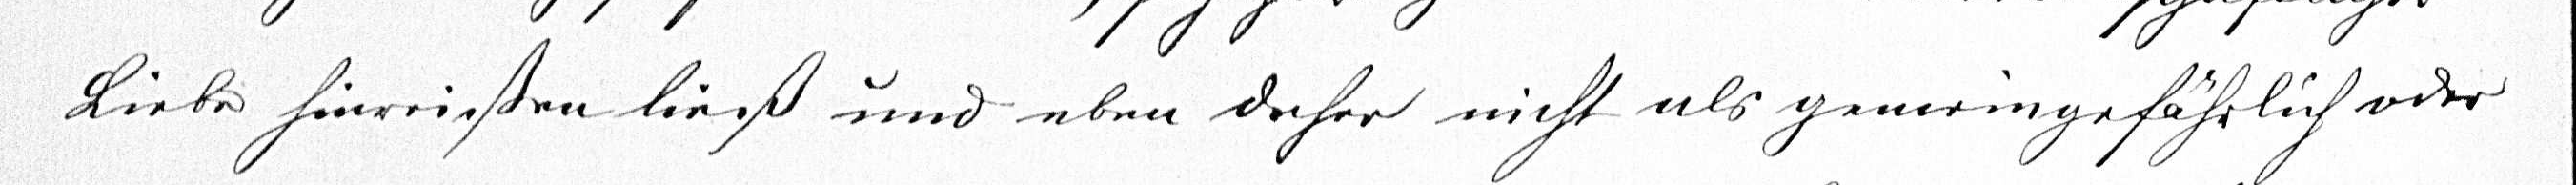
Liebe hinreißen ließ und eben daher nicht als gemeingefährlich oder
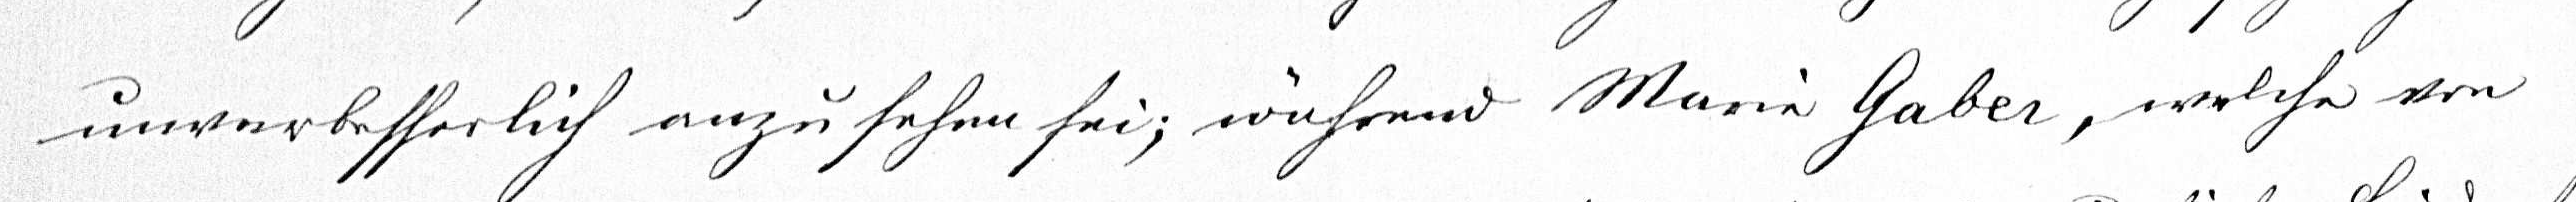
unverbesserlich anzusehen sei; während Marie Gaber, welche von
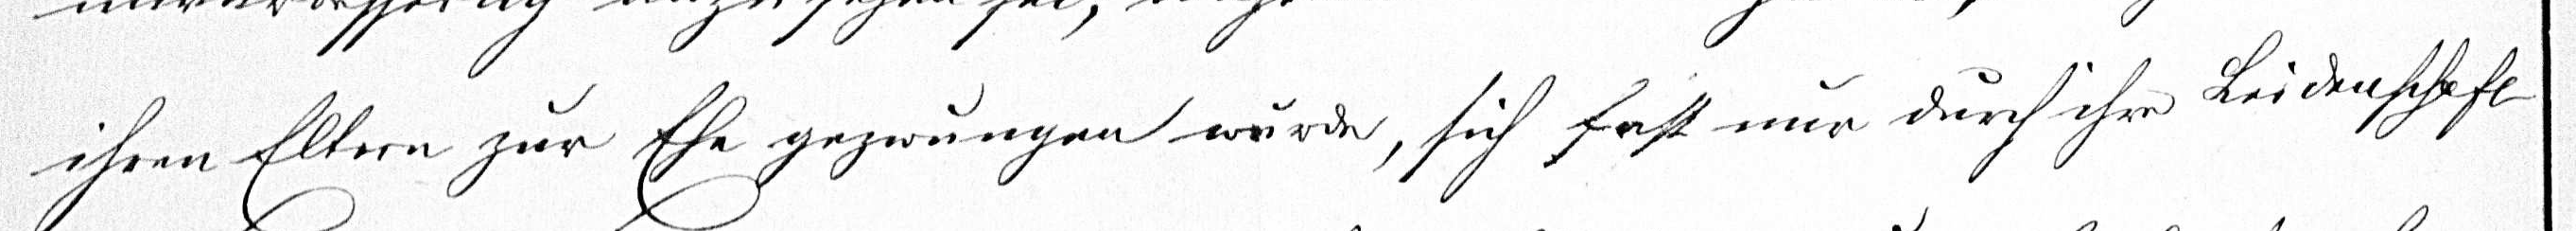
ihren Eltern zur Ehe gezwungen wurde, sich fast nur durch ihre Leidenschaft
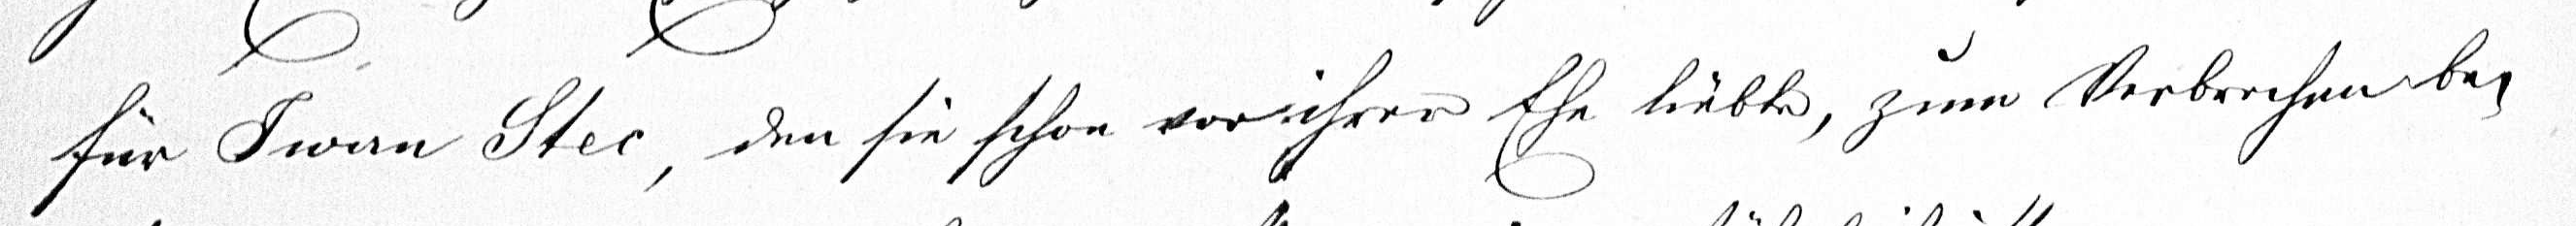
für Jwan Stec, den sie schon vorxxrer Ehe xx, zum Verbrechen be¬
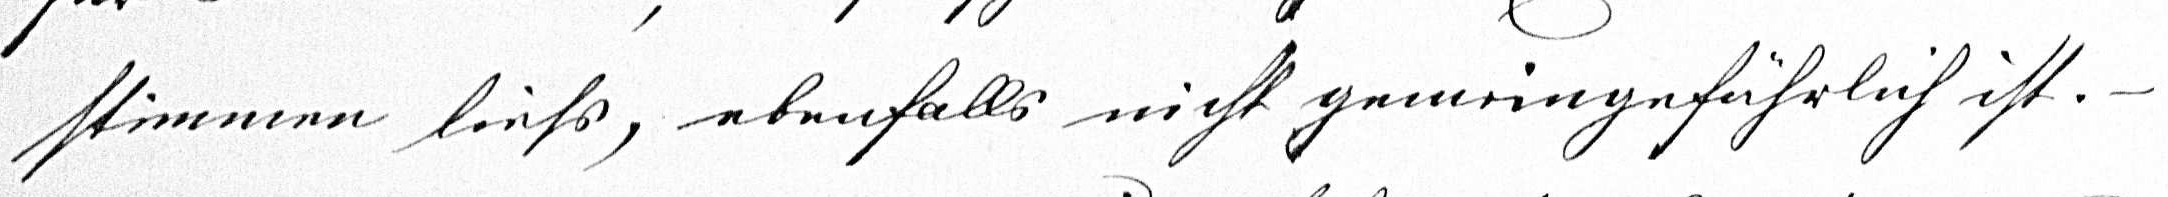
stimmen liess, ebenfalls nicht gemeingefährlich ist.-
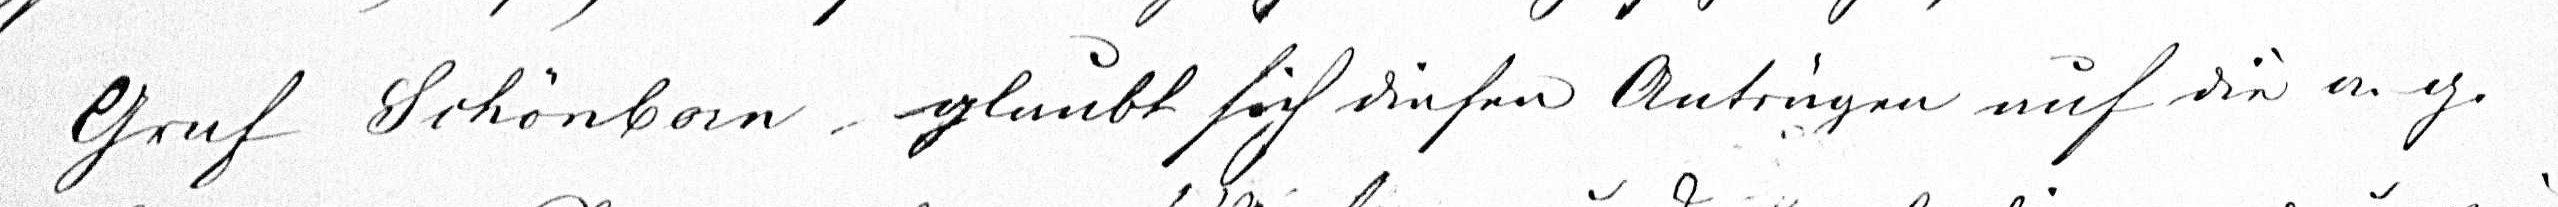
Graf Schönborn glaubt sich diesen Anträgen auf die a. g.
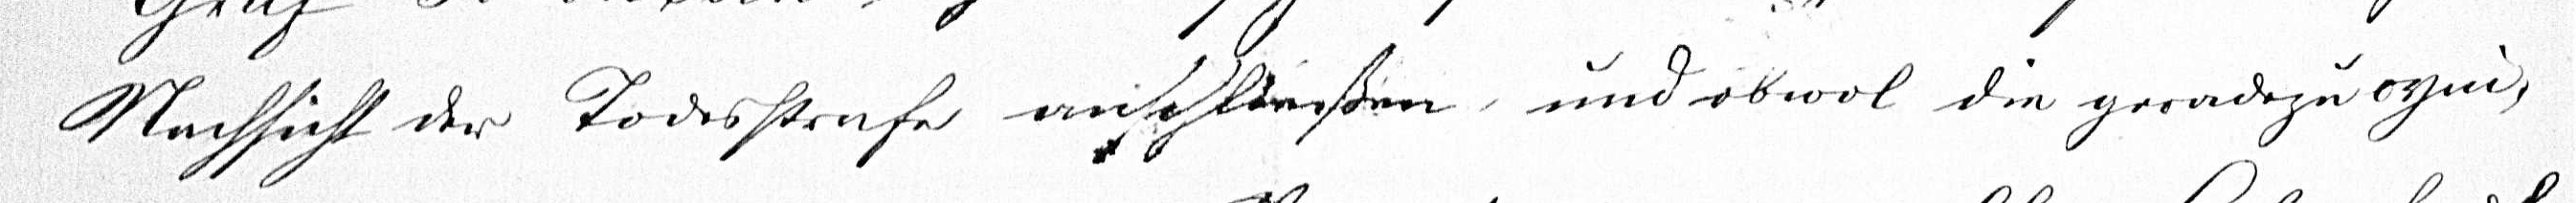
Nachsicht der Todesstrafe anschließen, und obwol die geradezu xx¬
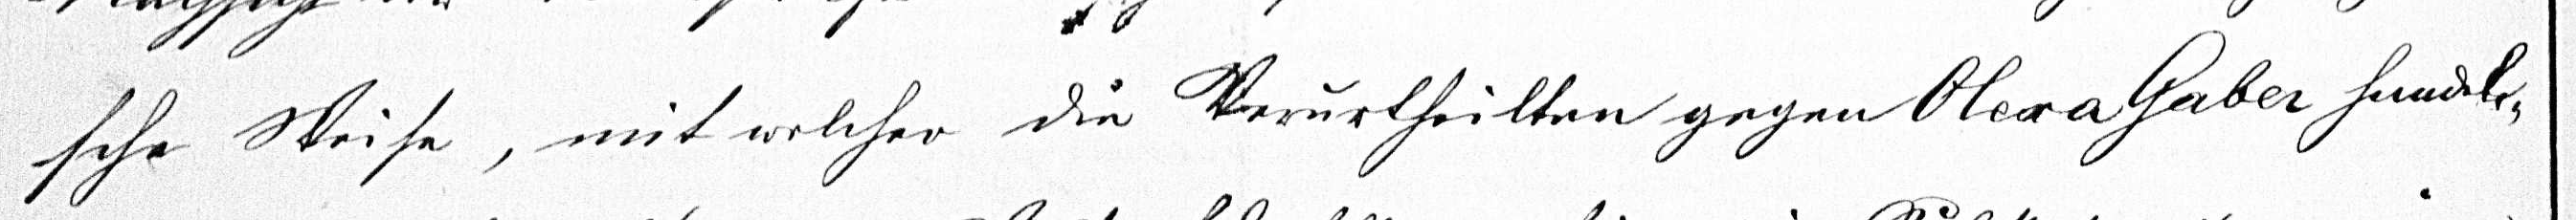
sche Weise, mit welcher die Verurtheilten gegen Olexa Gaber handel¬
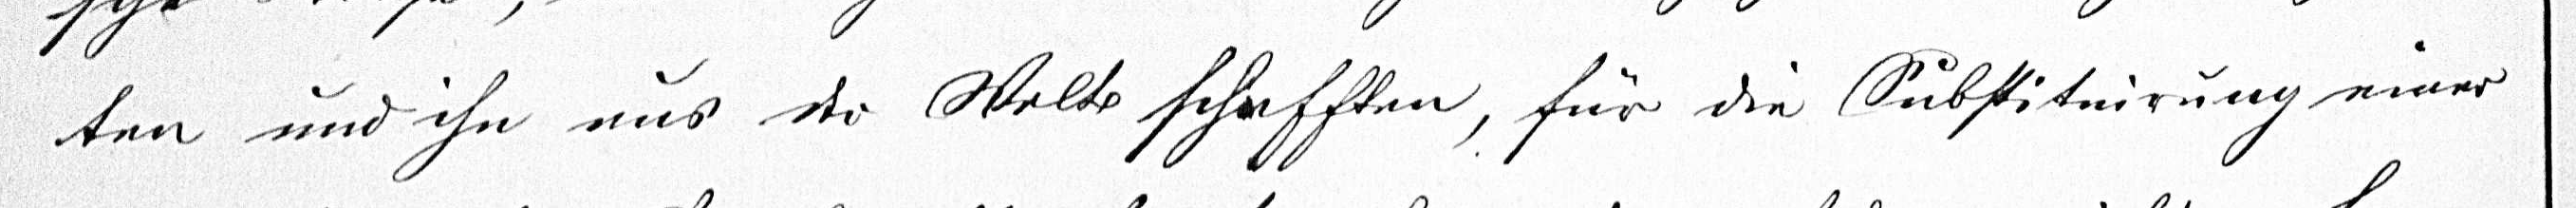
ten und ihn aus der Welt schafften, für die Substituirung einer
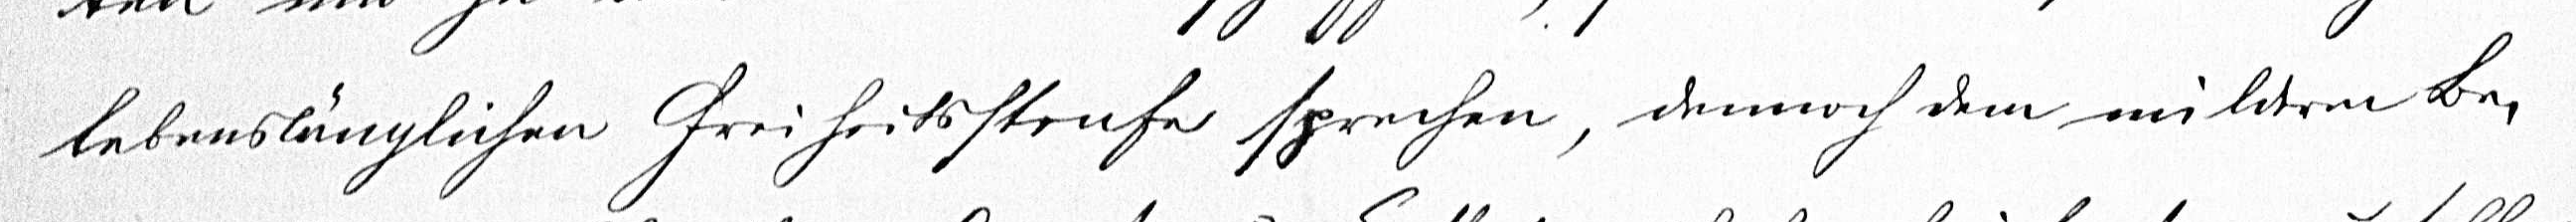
lebenslänglichen Freiheitsstrafe sprechen, dennoch dem mildern Be¬
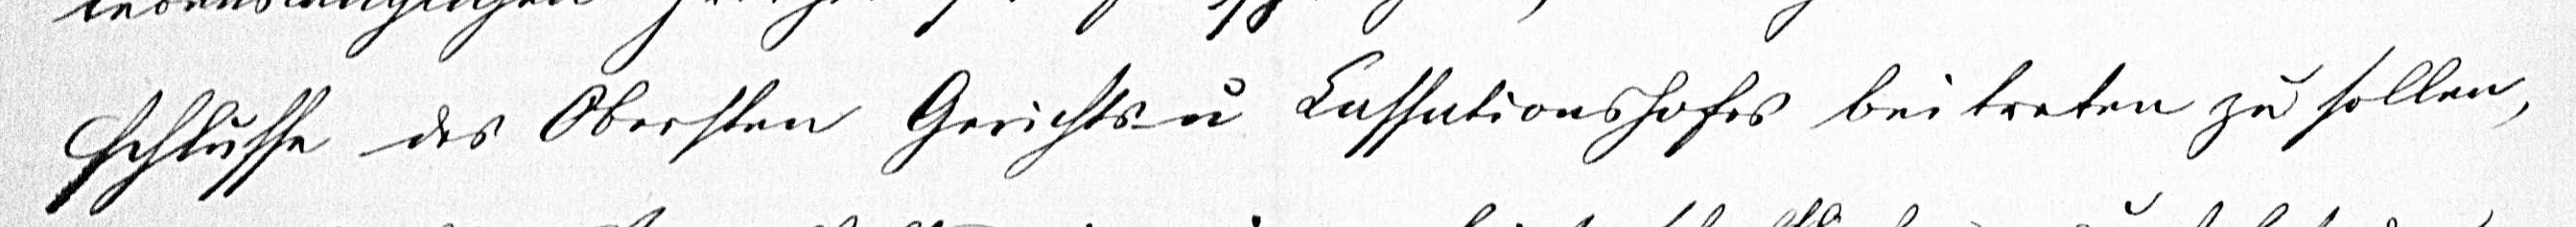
schlusse des Obersten Gerichts- u Cassationshofes beitreten zu sollen,
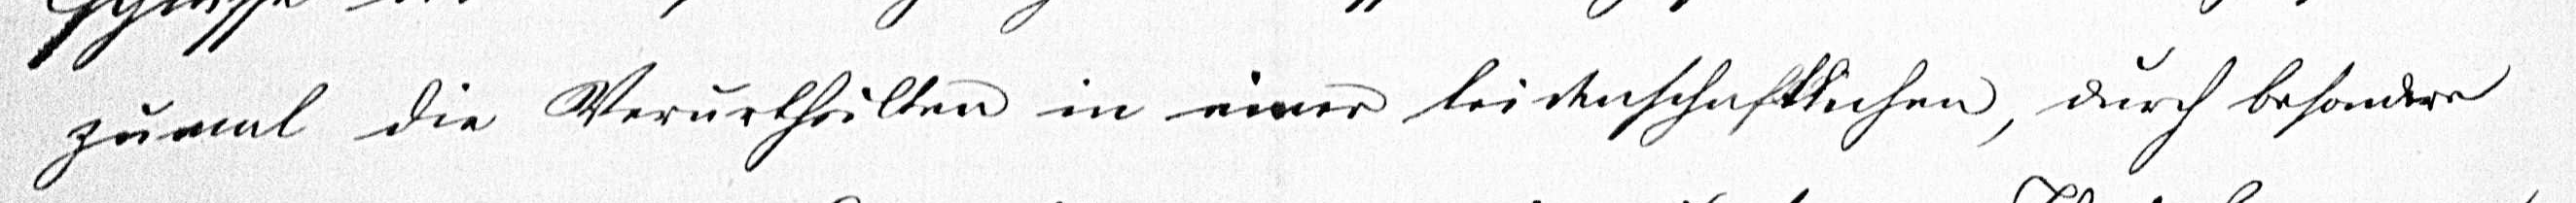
zumal die Verurtheilten in einer leidenschaftlichen, durch besondere
